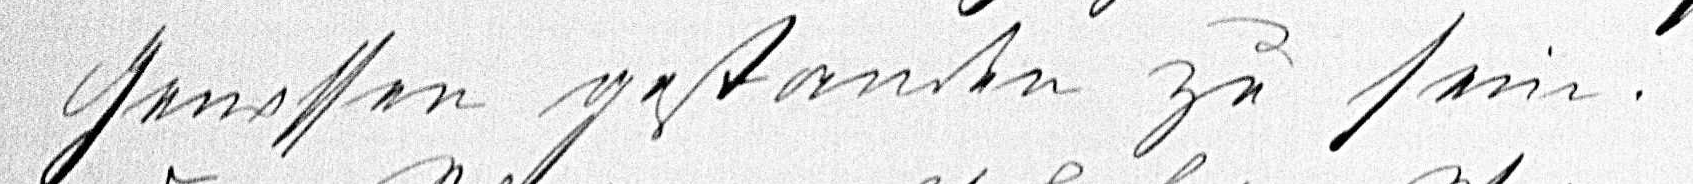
Genossen gestanden zu sein.
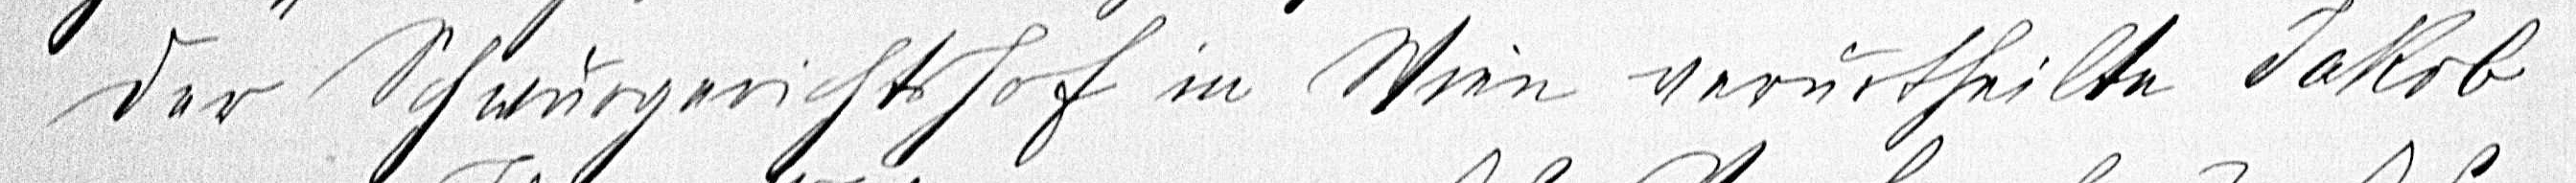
Der Schwurgerichtshof in Wien verurtheilte Jakob
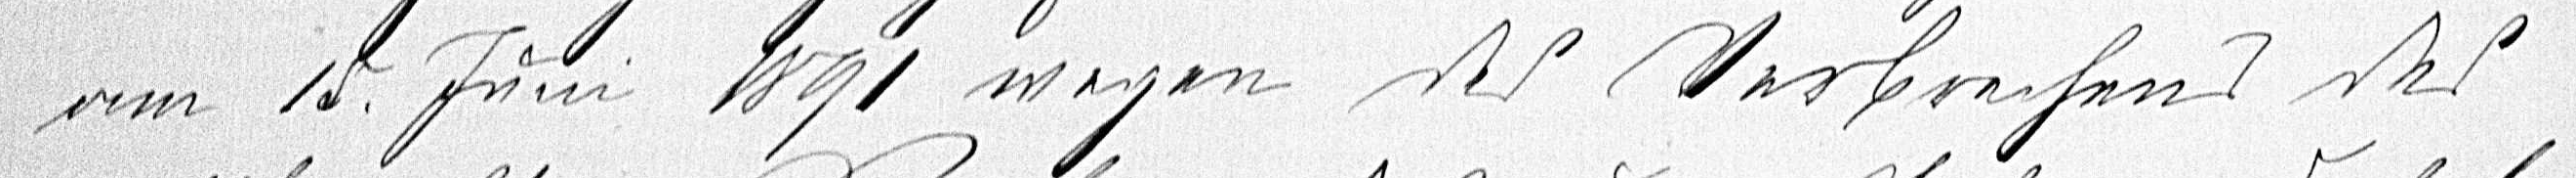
am 15. Juni 1891 wegen des Verbrechens des
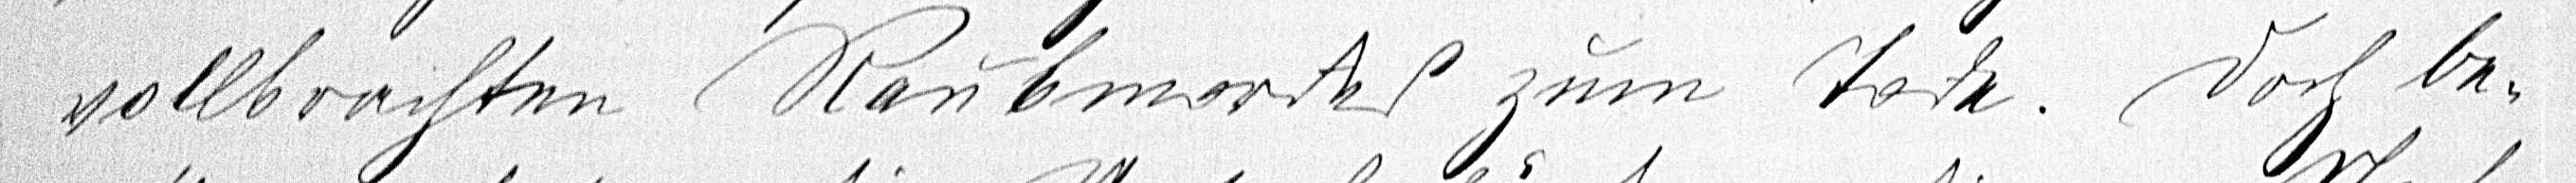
vollbrachten Raubmordes zum Tode. Doch be¬
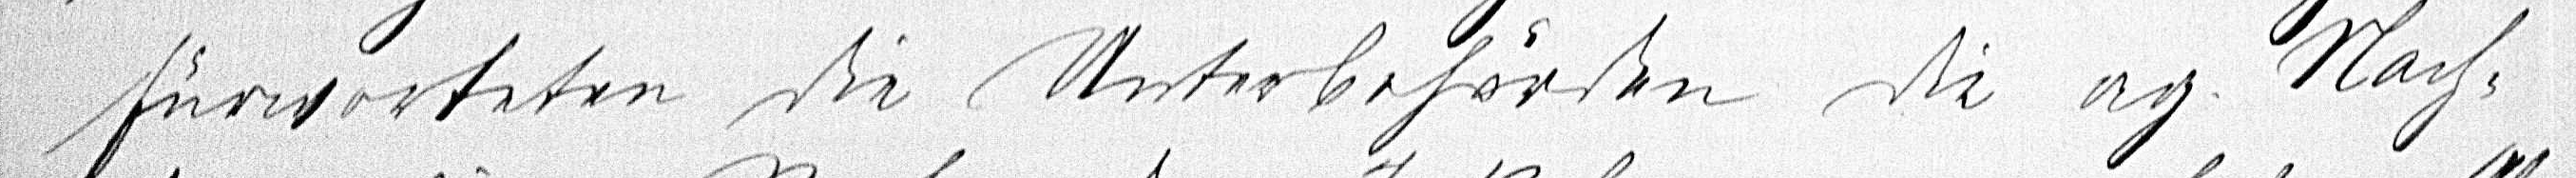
fürworteten die Unterbehörden die ag. Nach¬
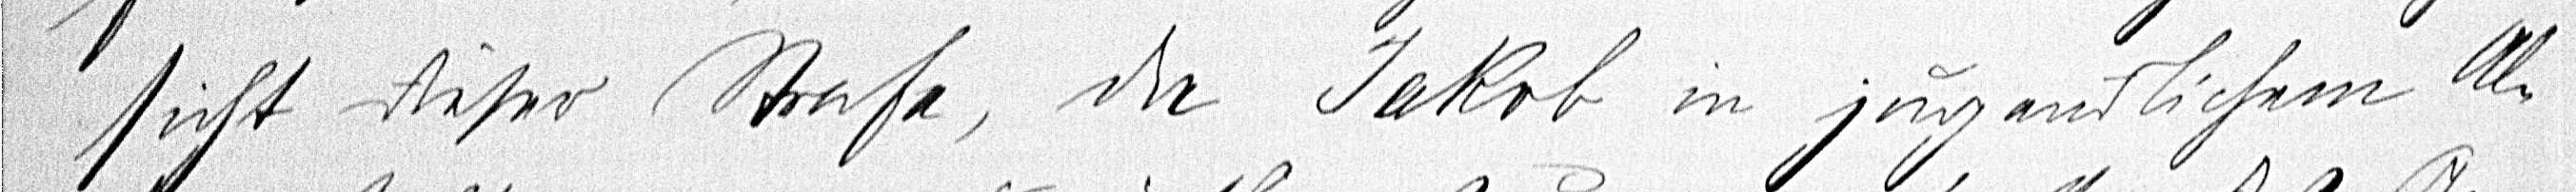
sicht dieser Strafe, da Jakob in jugendlichem Al¬
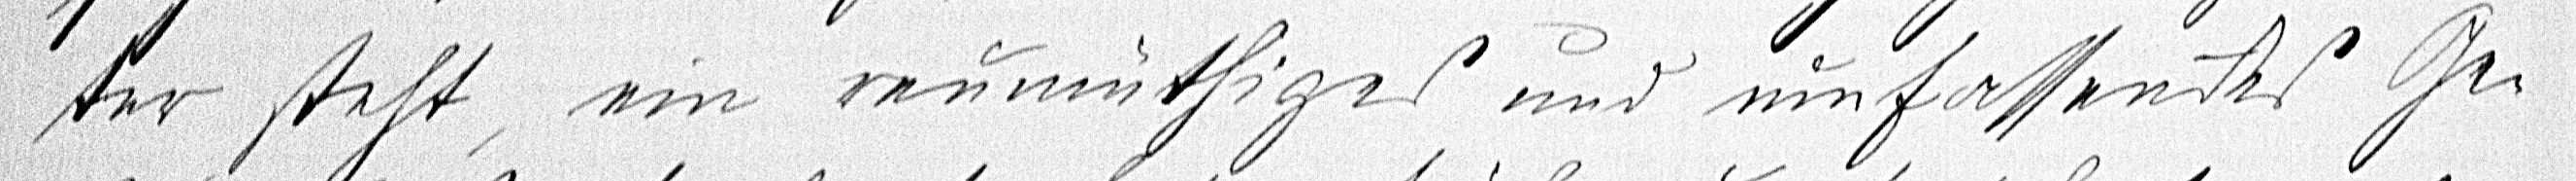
ter steht, ein reumüthiges und umfassendes Ge¬
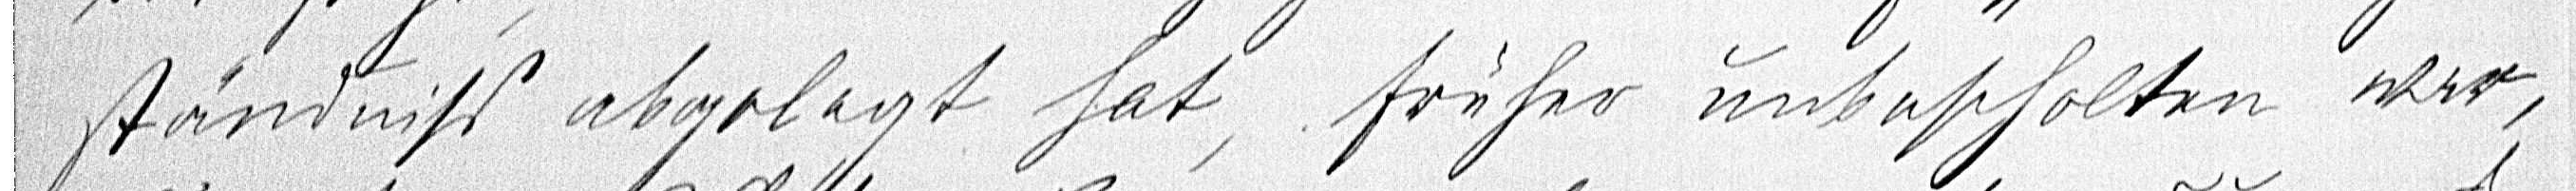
ständniß abgelegt hat, früher unbescholten war,
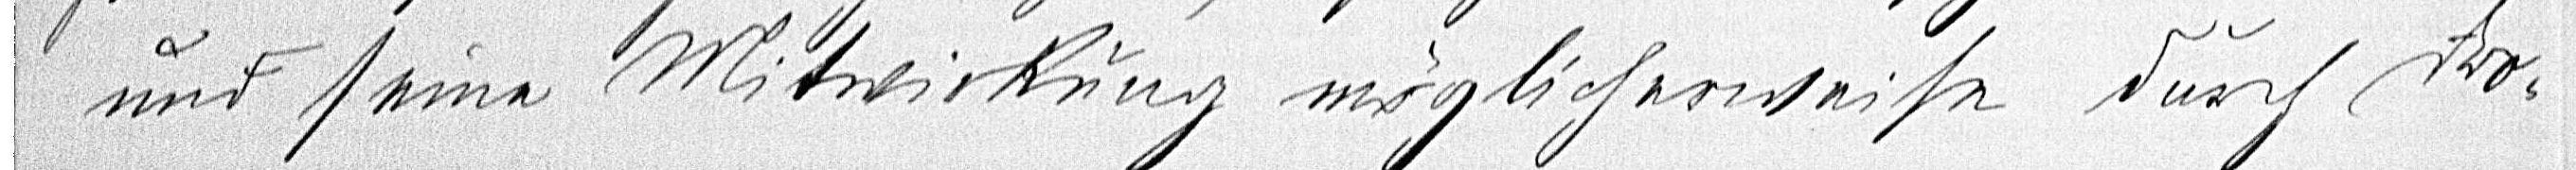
und seine Mitwirkung möglicherweise durch Dro¬
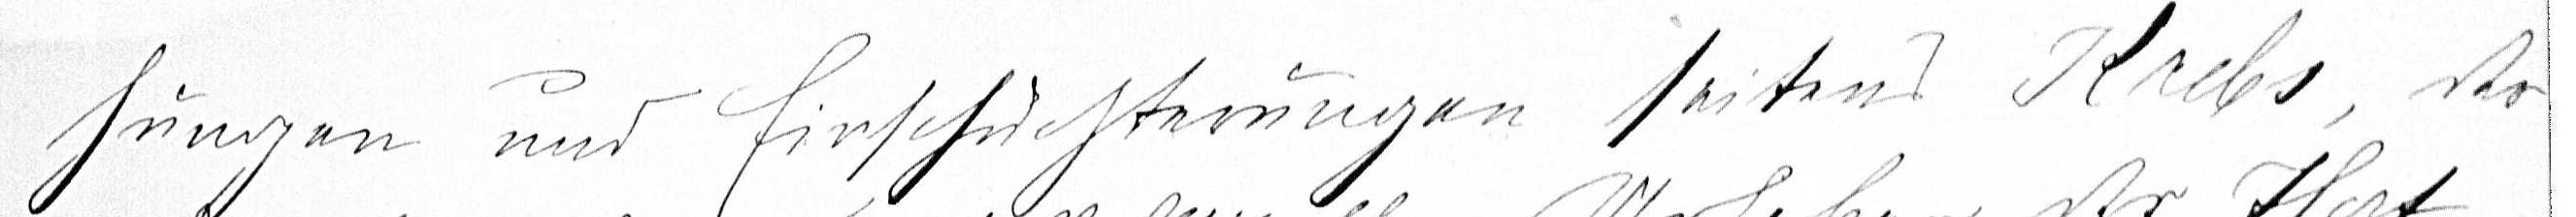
hungen und Einschüchterungen seitens Krebs, der
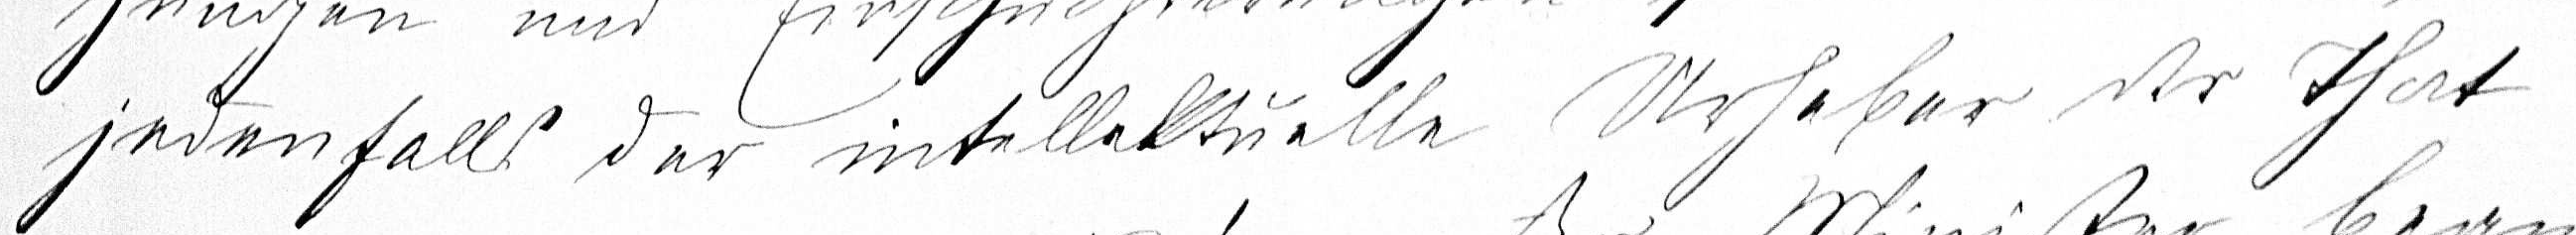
jedenfalls der intellektuelle Urheber der That
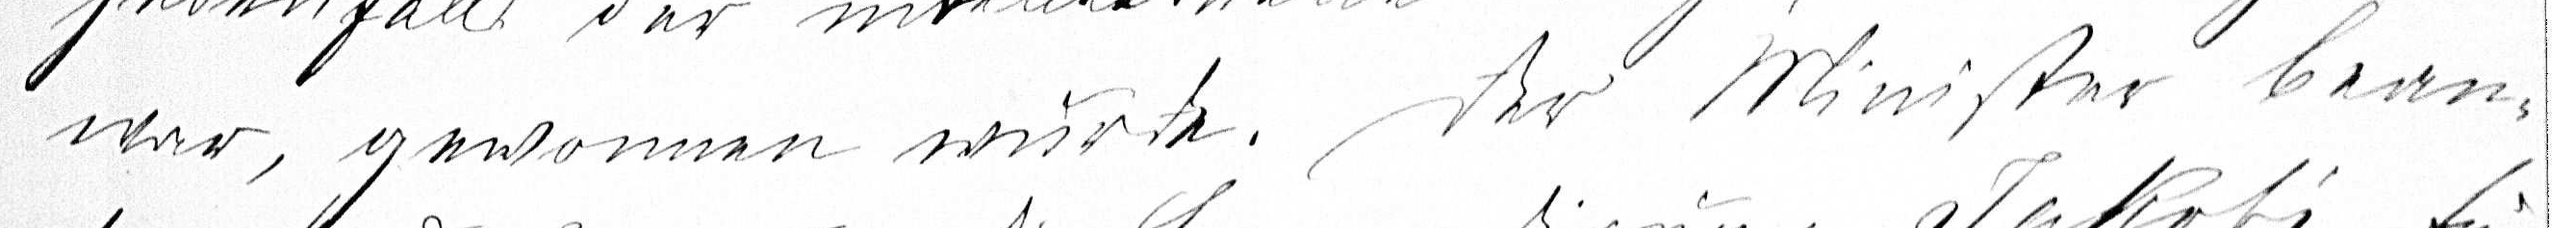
war, gewonnen wurde. Der Minister bean¬
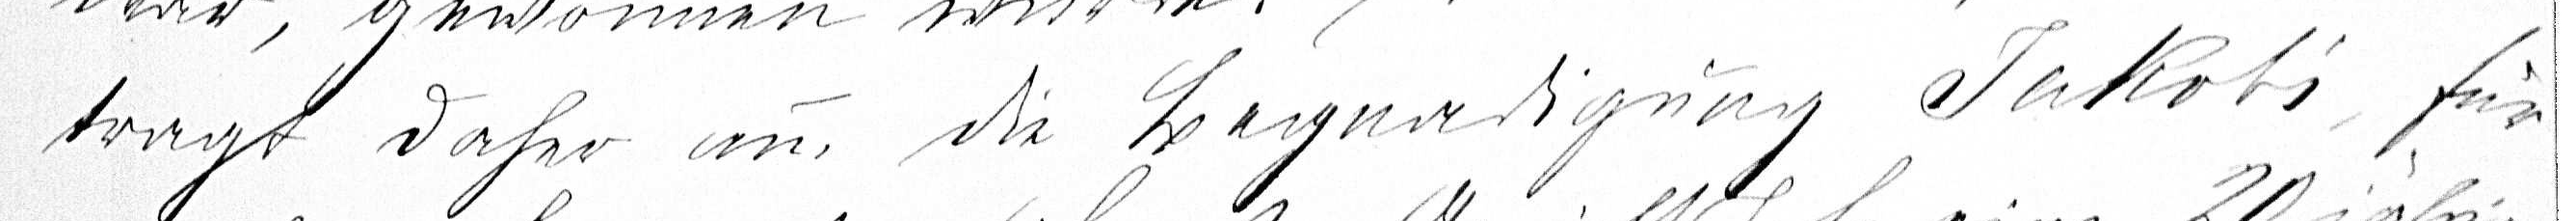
tragt daher an, die Begnadigung Jakob’s, für
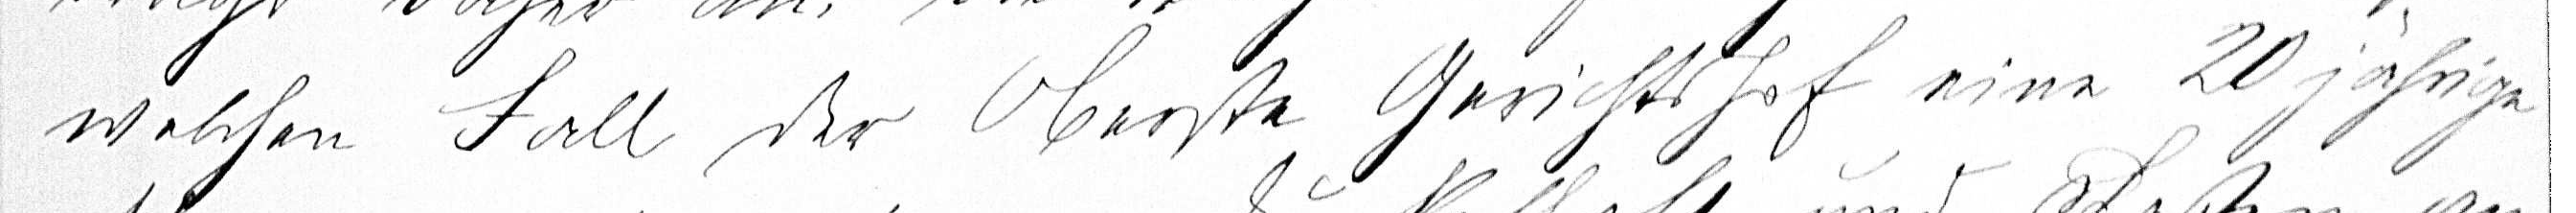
welche Fall der Oberste Gerichtshof eine 20jährige,
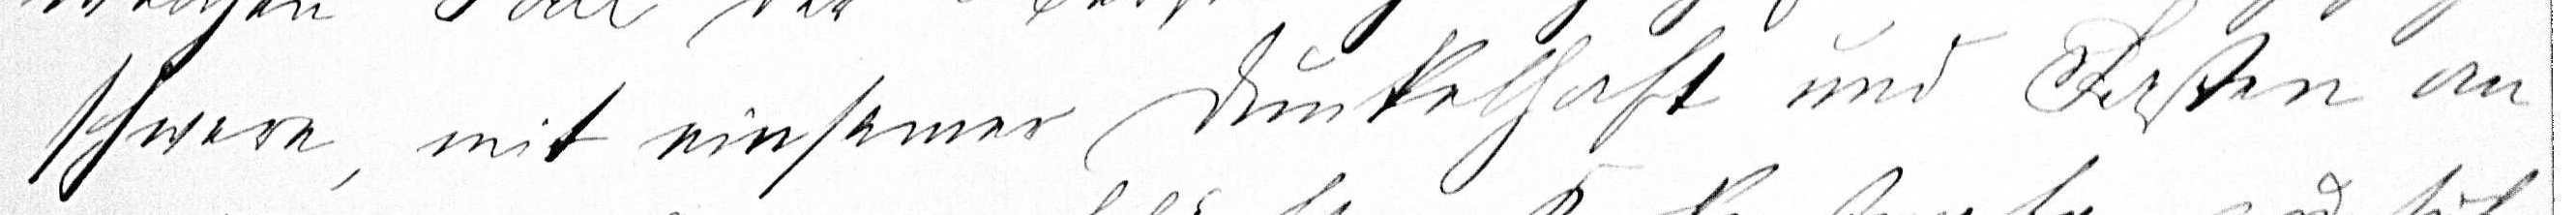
schwere, mit einsamer Dunkelhaft und Fasten an
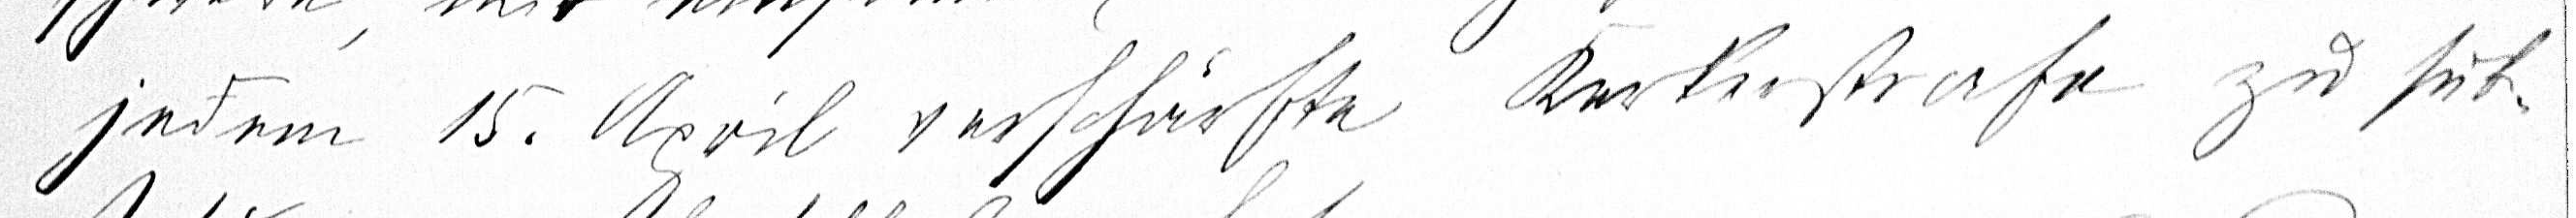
jedem 15. April verschärfte Kerkerstrafe zu sub¬
